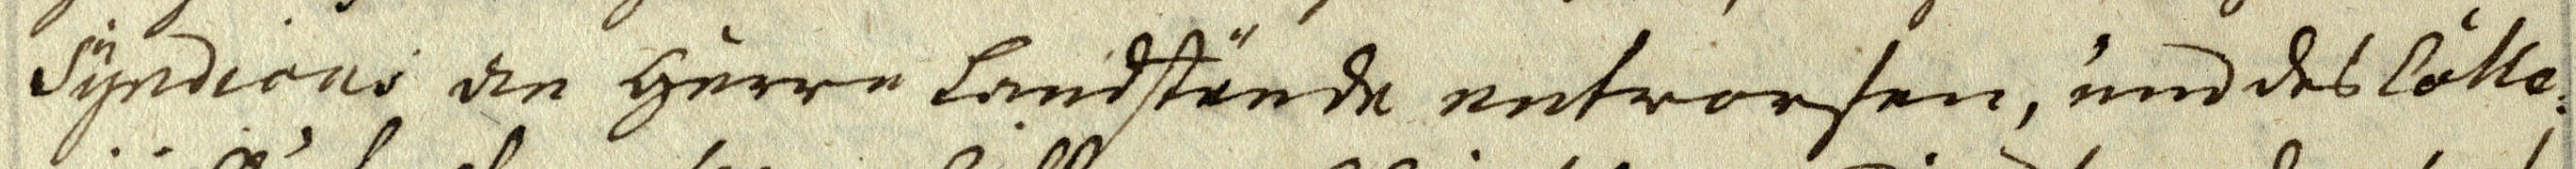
Sÿndicus den Herrn Landstände entworfen, und des Colle¬
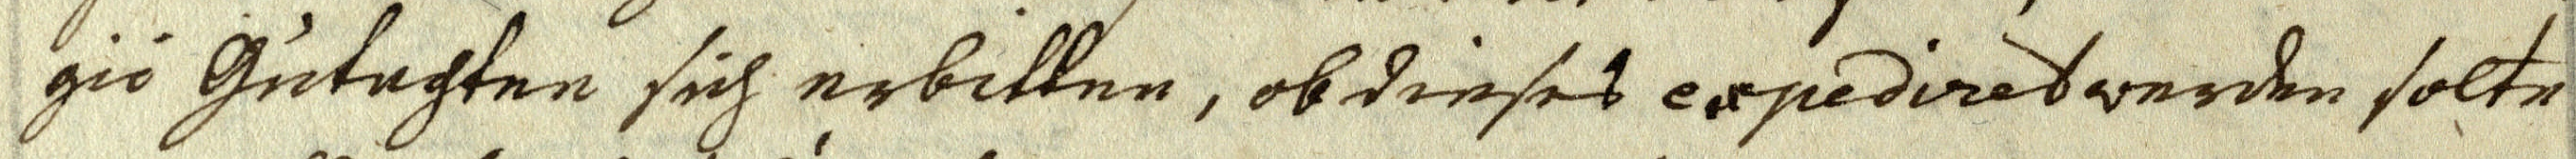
gii Gutachten sich erbitten, ob dieses expediret werden solte
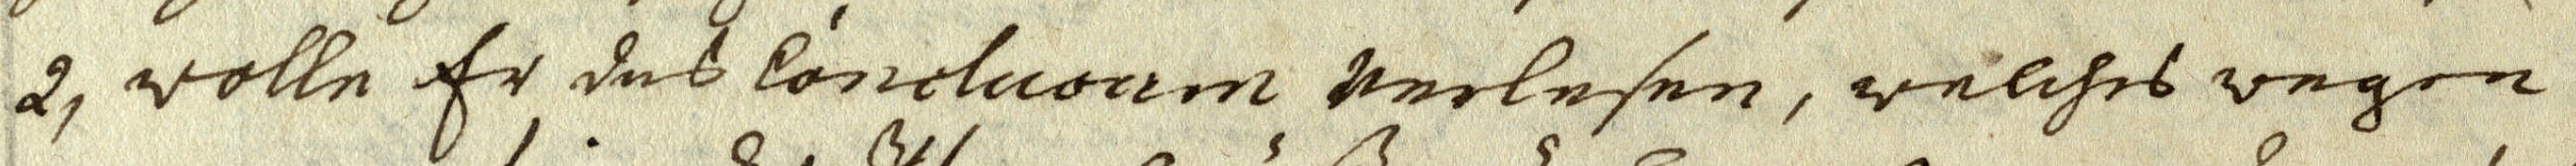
2, wolle Er das Conclusum verlesen, welches wegen
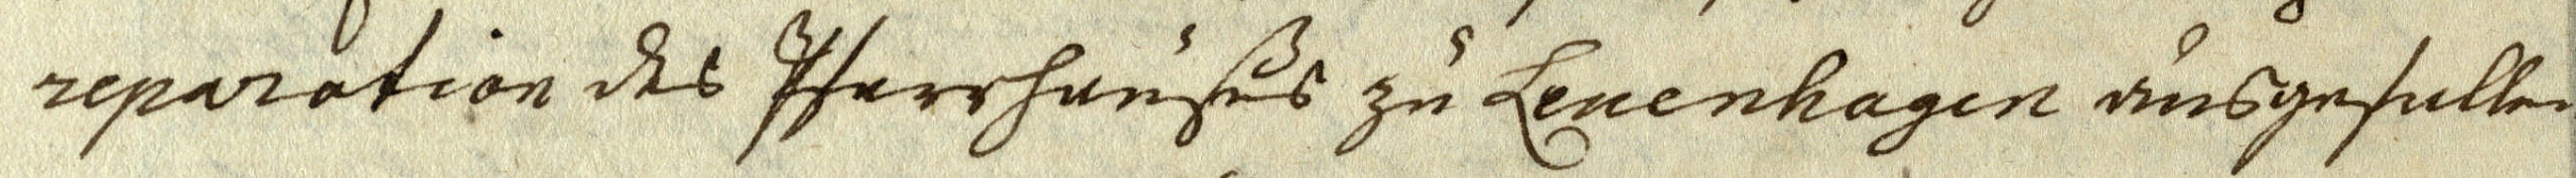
reparation des Pfarrhauses zu Levenhagen ausgefallen.
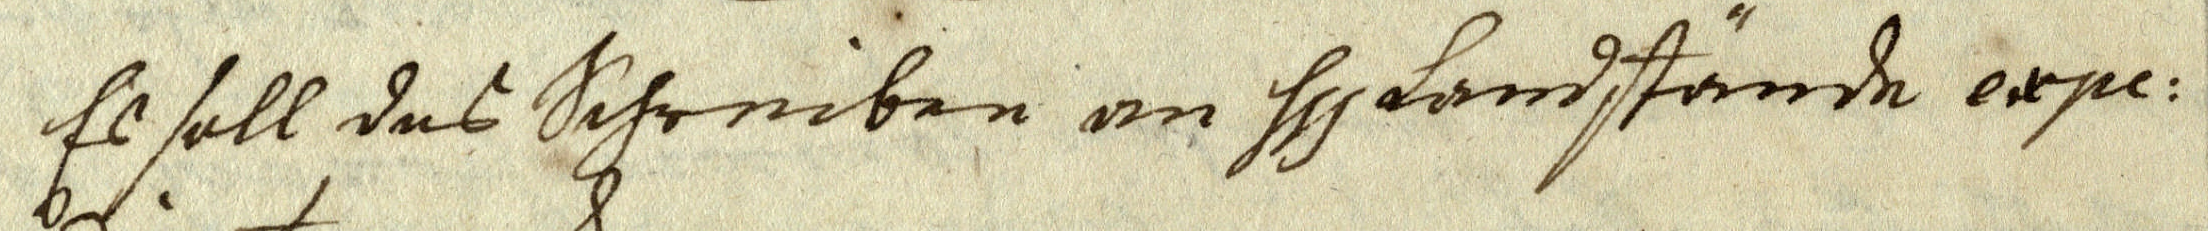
Es soll das Schreiben an H Landstände expe¬
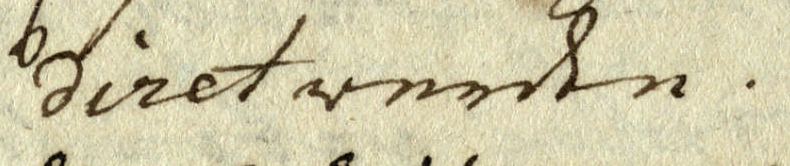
diret werden.
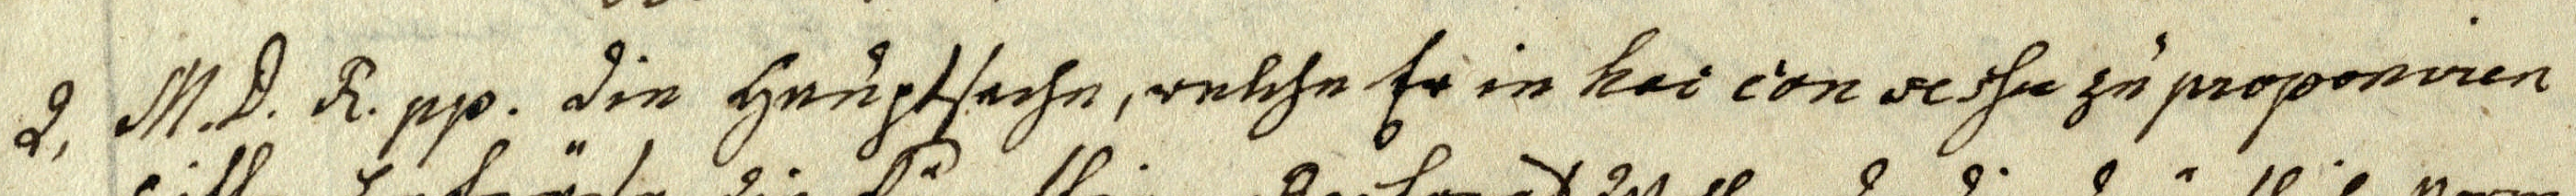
2. M. D. R. pp. die Hauptsache, welche Er in hoc consessu zu proponiren
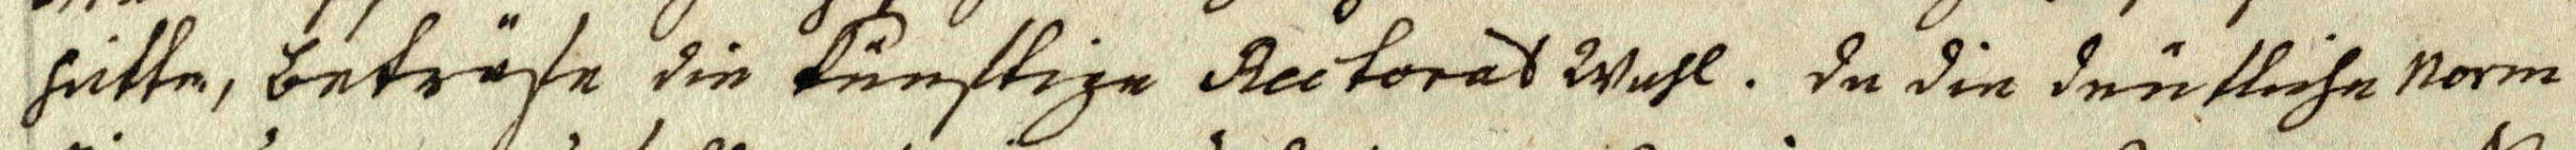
hätte, beträfe die künftige Rectorat Wahl. da die deutliche Norm
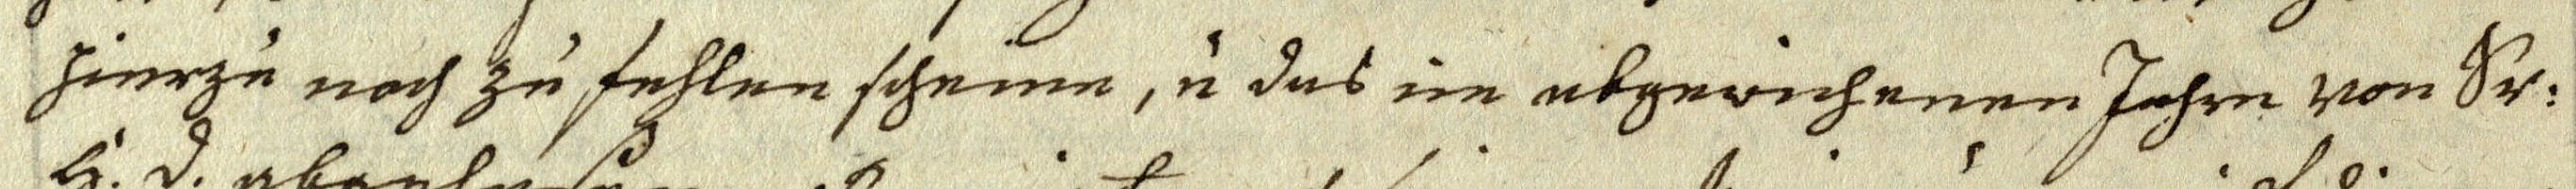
hierzu noch zu fehlen scheine, u das im abgewichenen Jahre von Sr
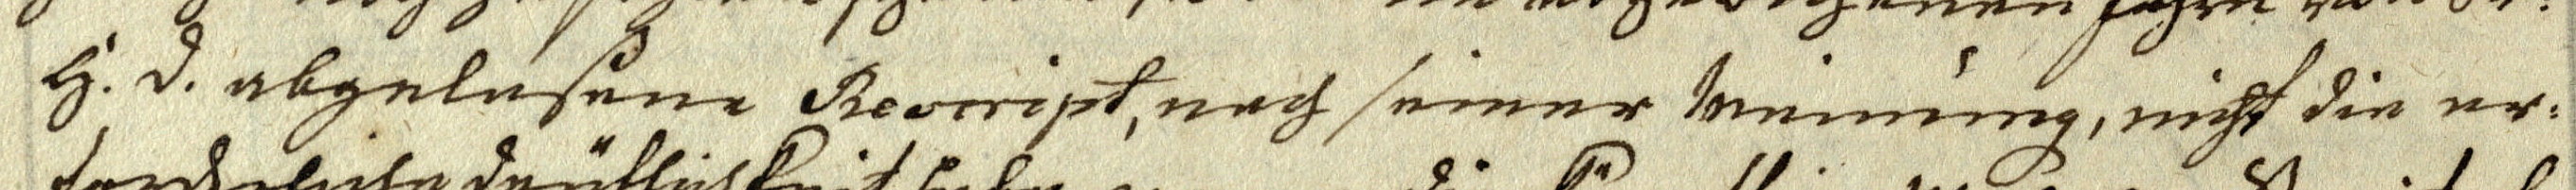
H. d. abgelaßene Rescript, nach seiner Meinung, nicht die er¬
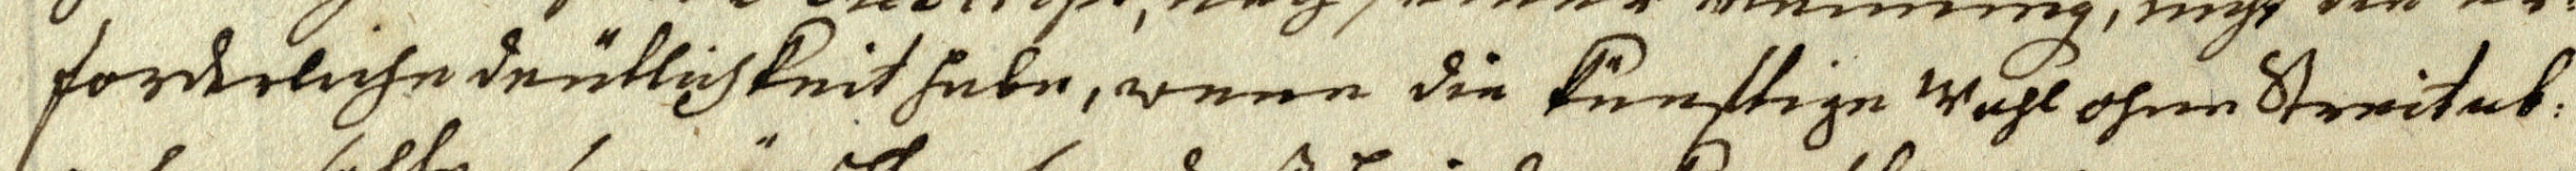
forderliche Deutlichkeit habe, wenn die künftige Wahl ohne Streit ab¬
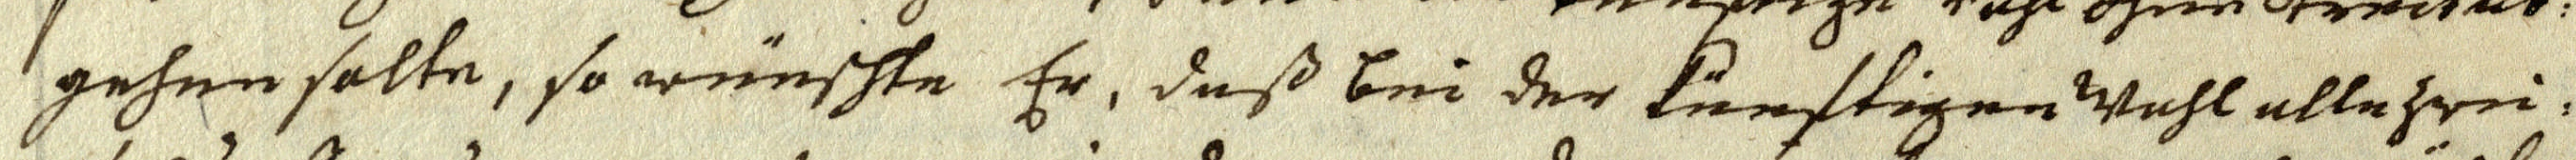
gehen solte, so wünschte Er, daß bei der künftigen Wahl alle Zwei¬
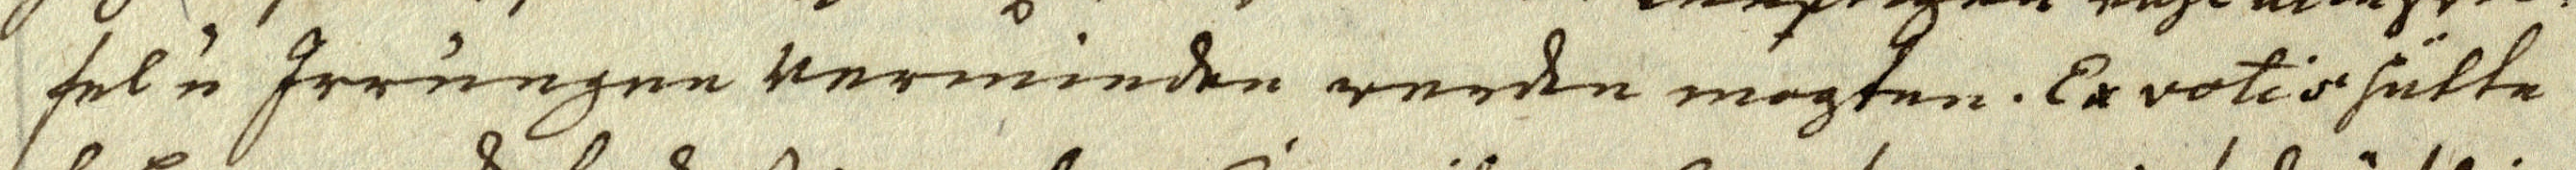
fel u Irrungen vermieden werden mögten. Ex votis hätte
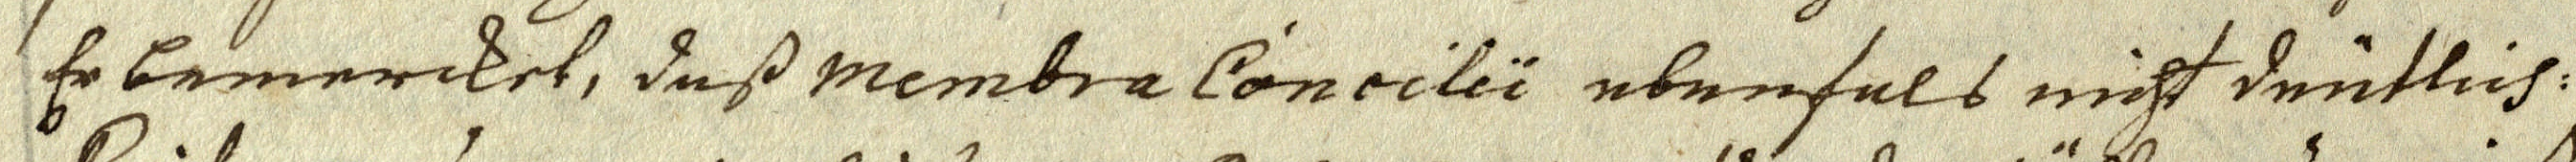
Er bemercket, daß membra Concilii ebenfals nicht Deutlich¬
